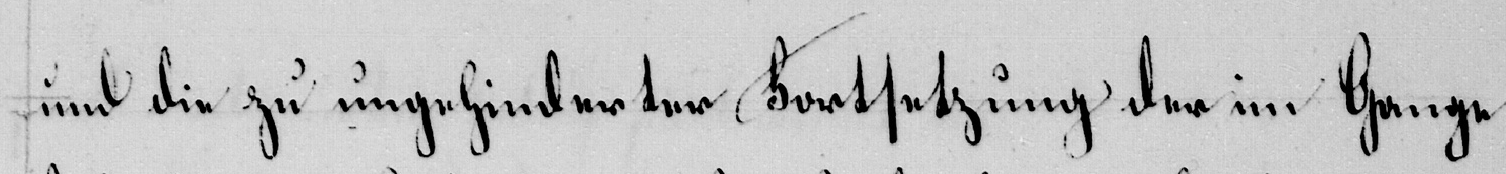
und die zu ungehinderter Fortsetzung der im Gange
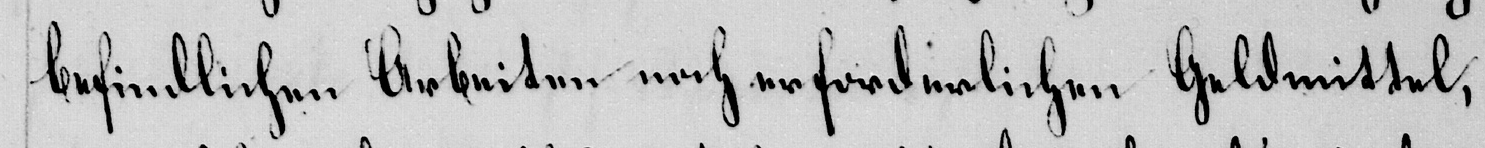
befindlichen Arbeiten noch erforderlichen Geldmittel,
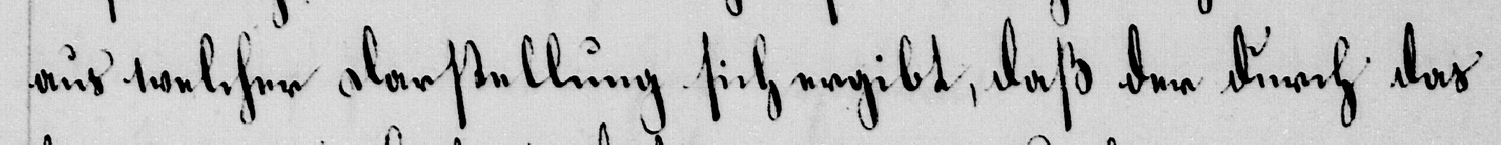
aus welcher Vorstellung sich ergibt, daß der durch das
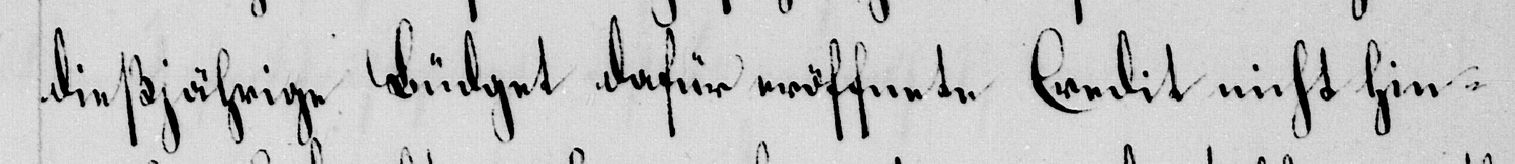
dießjährige Büdget dafür eröffnete Credit nicht hin¬
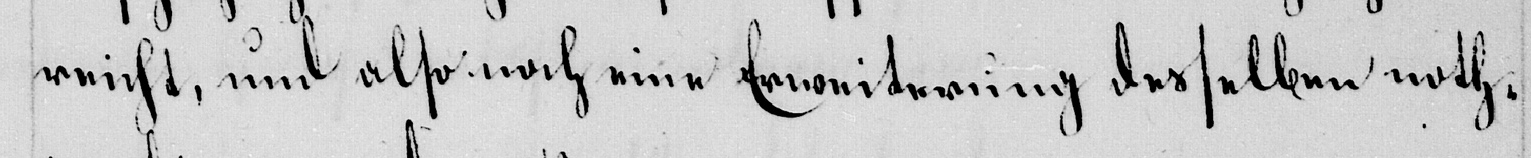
reicht, und also noch eine Erweiterung desselben noth¬
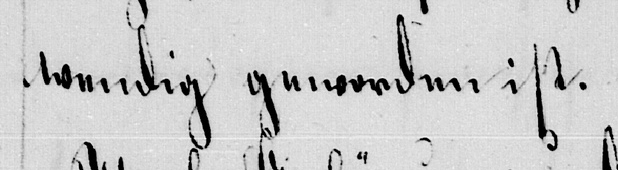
wendig geworden ist.
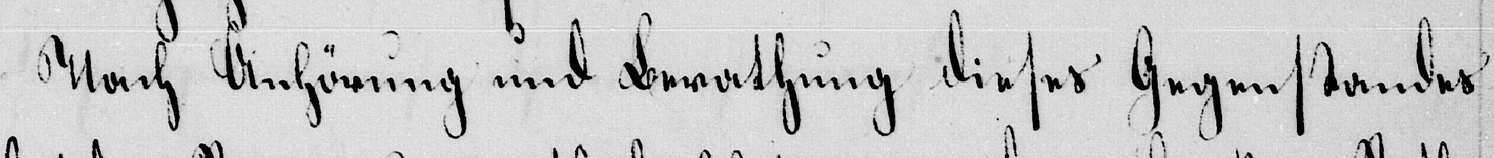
Nach Anhörung und Berathung dieses Gegenstandes
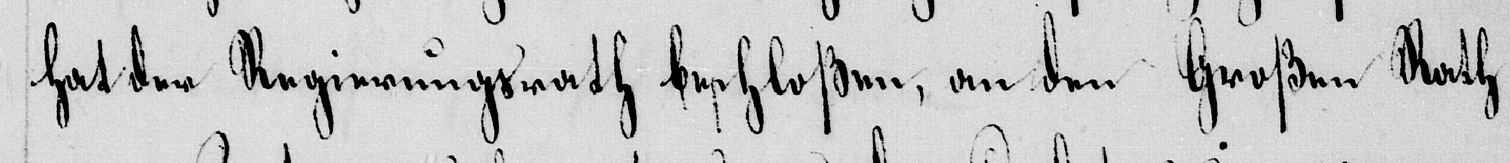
hat der Regierungsrath beschloßen, an den Großen Rath
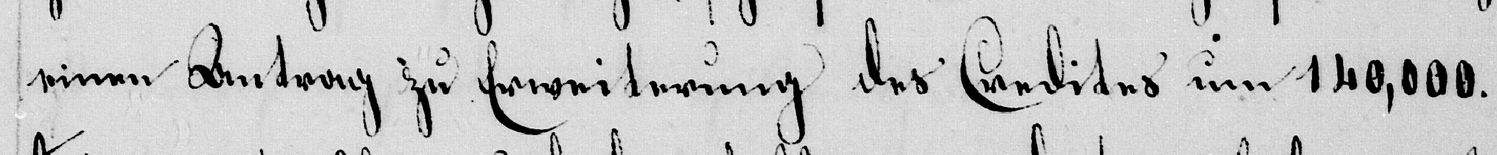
einen Antrag zu Erweiterung des Credites um 140,000.
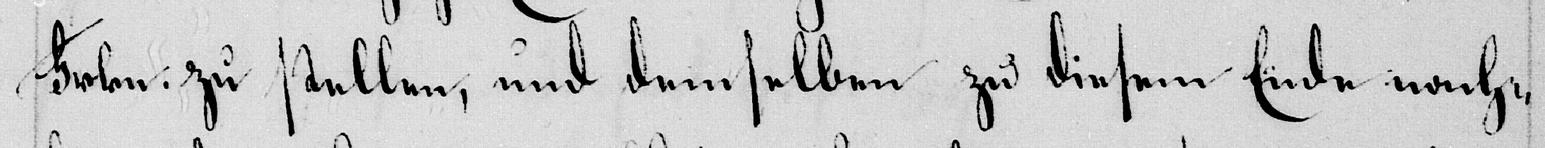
Frkn. zu stellen, und demselben zu diesem Ende nach¬
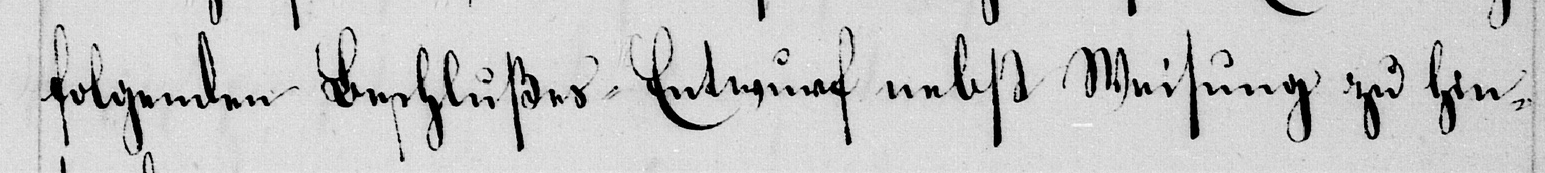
folgenden Beschlußes-Entwurf nebst Weisung zu hin¬
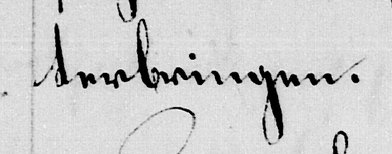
terbringen.
